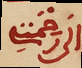إلى رحمتي
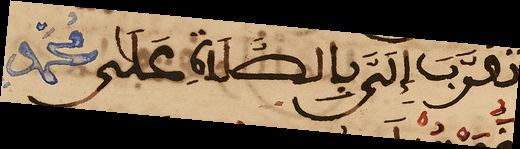تقرب إلى بالصلاة على محمد
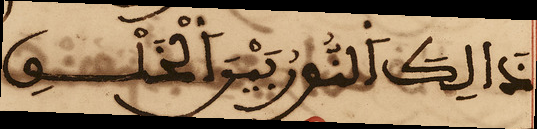ذالك النور بين الخلق
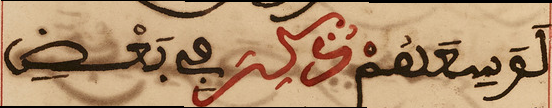لوسعهم ذكر في بعض
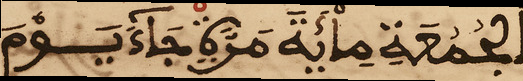الجمعة ماية مرة جآء يوم
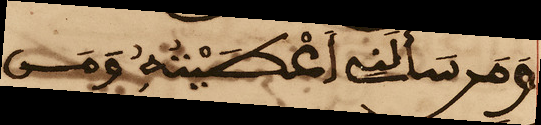ومن سألبي أعطيته ومن
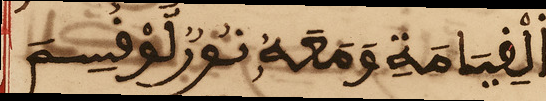القيامة ومعه نور لو قسم
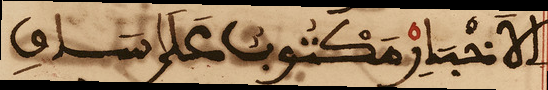الاخبار مكتوب على ساق
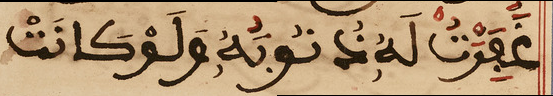غفرت له ذنوبه ولو كانت
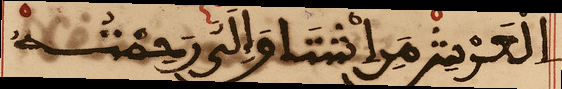العرش من اشتاق الى رحمته
